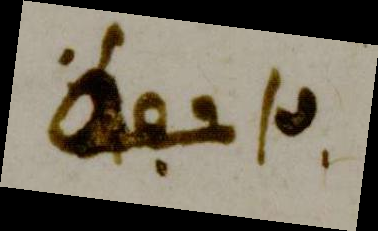به حفظ
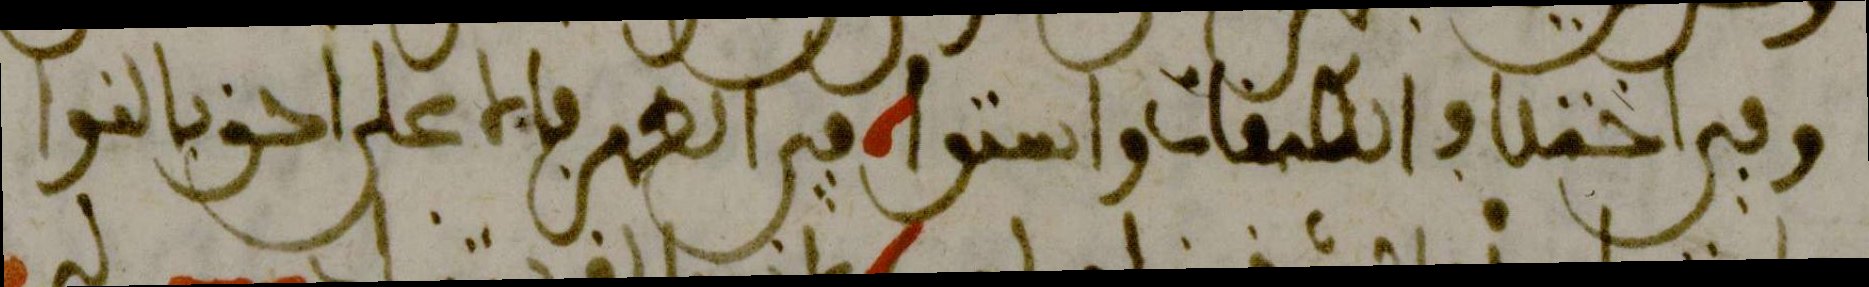وفي اختلاف الطبقات وواستوا في الطهر فالاعلى احق بالنوا
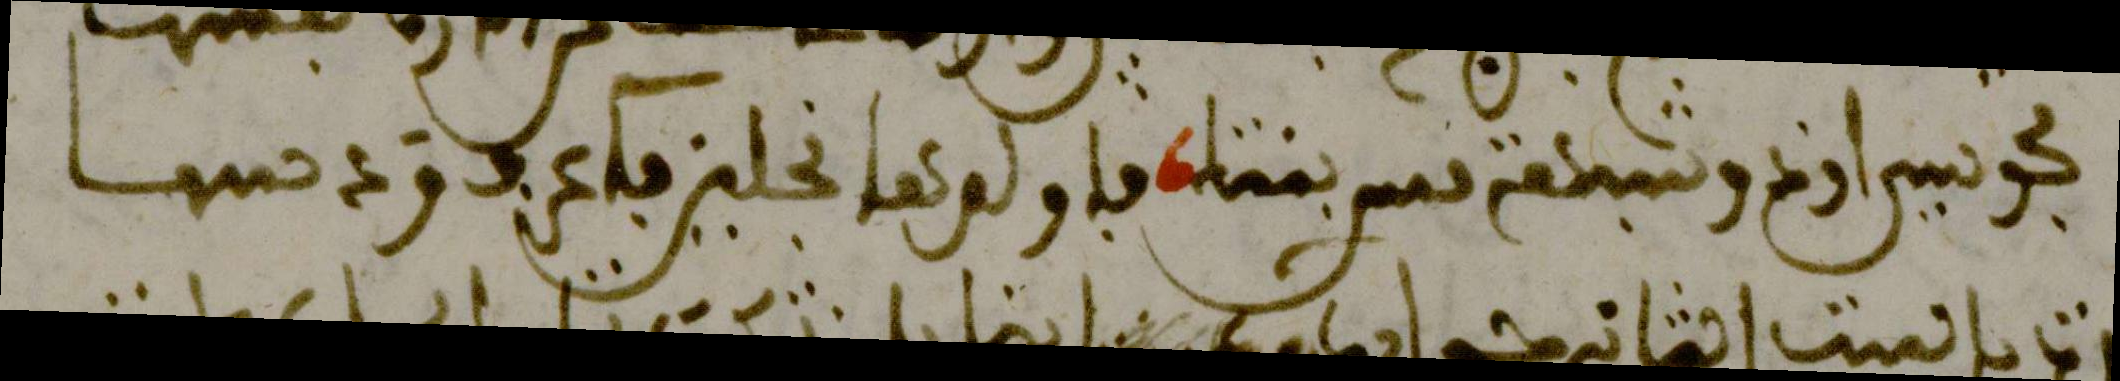مجوسي او ذو شبهة مس بنته فاولدها نجلين فاعرف وَدسها
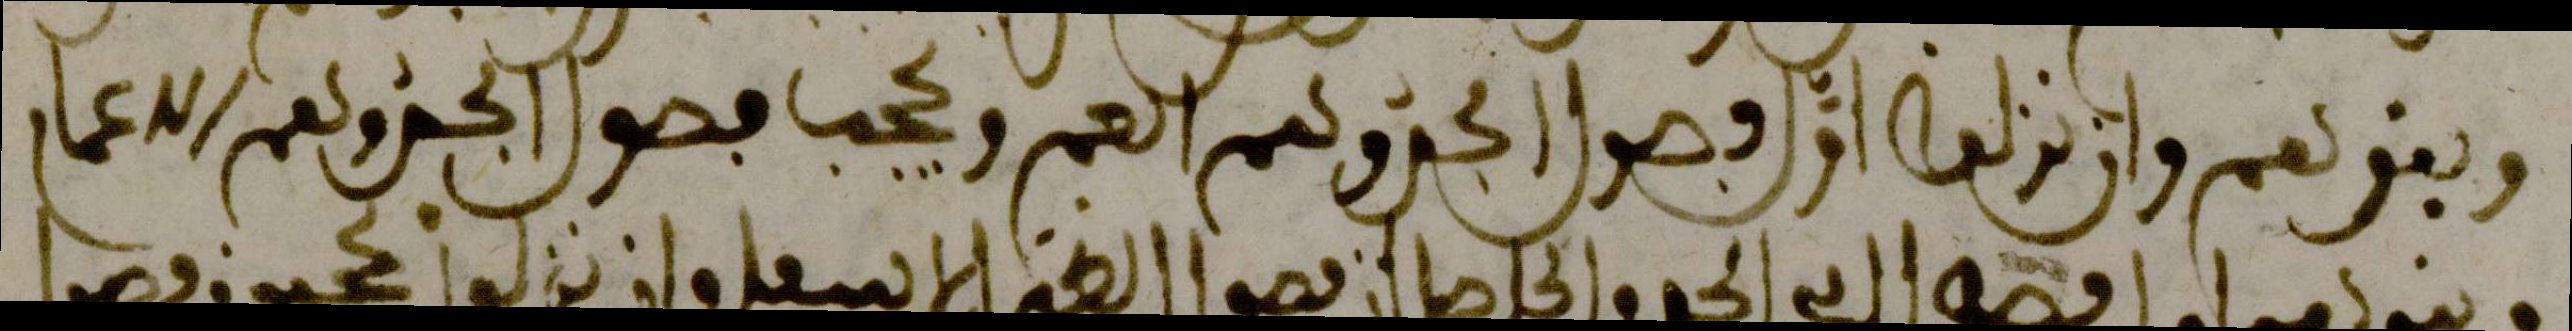وبنوهم وان نزلوا اوّل فصول الجد وهم العم ويحجب فصول الجد وهم الاعمام
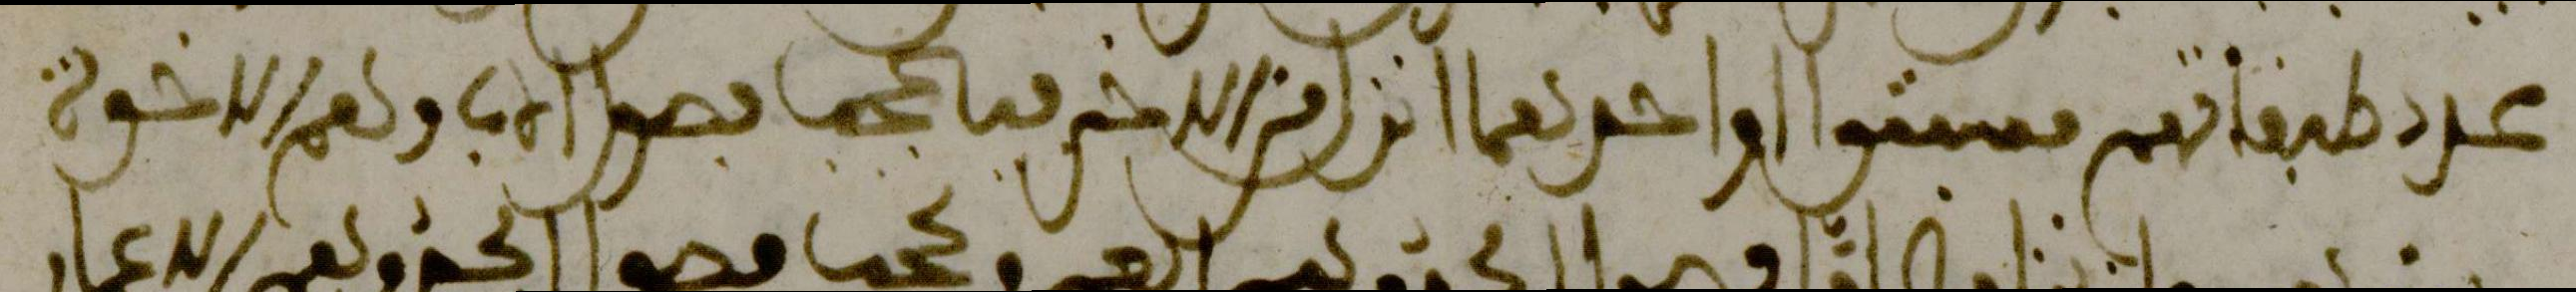عدد طبقاتهم مستوا او احدهما انزل من الاخر فيحجب فصول الاب وهم الاخوة
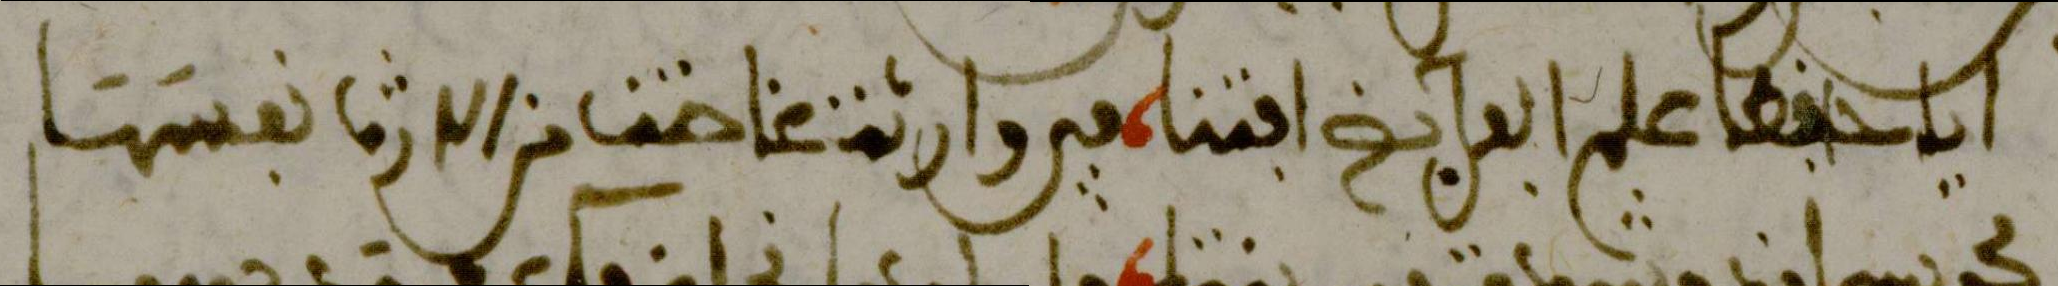ايا حافظا علم الفرائض افتنا في وارثت غاضت من الارث نفسَهَا
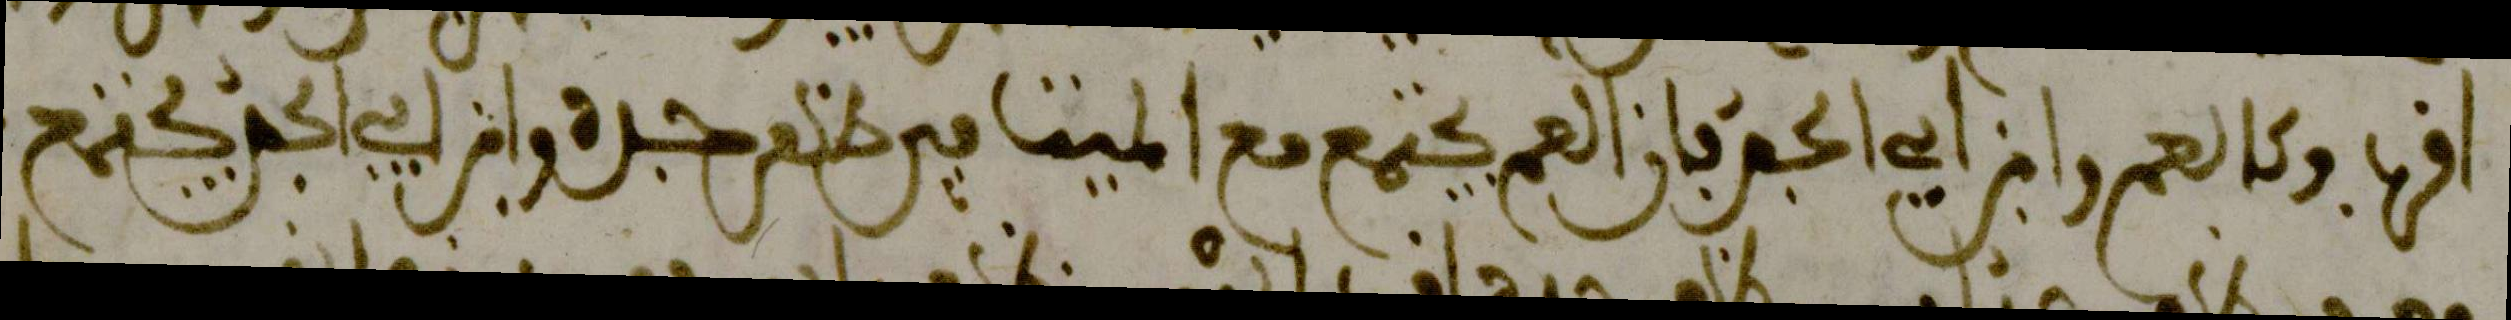اقرب وكالعم وابن ابي الجد فان العم يجتمع مع الميت في ظهر جده وابن ابي الجد يجتمع
